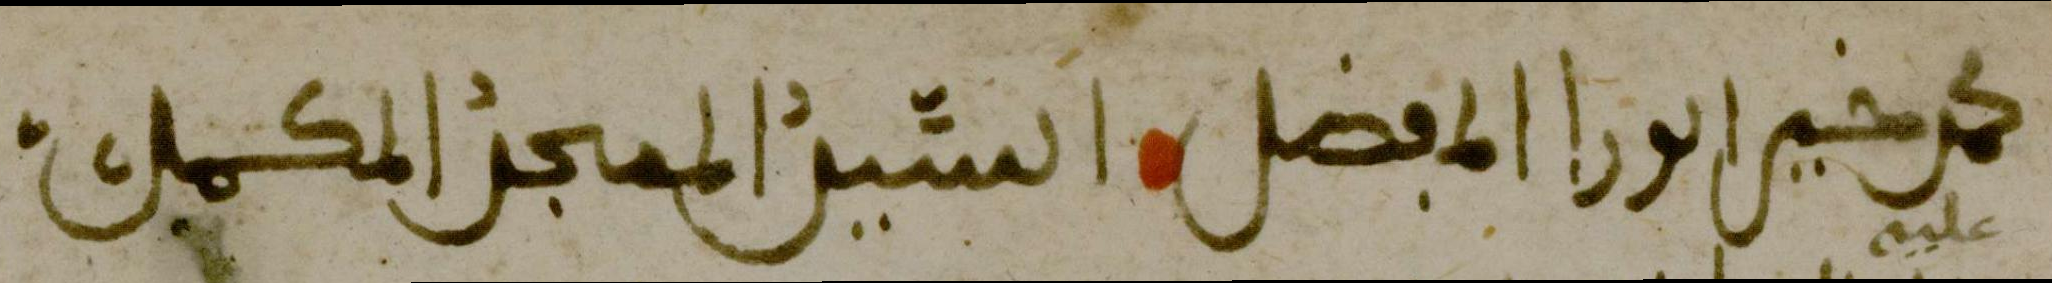محمد خير الورا المفضل السّيد الممجد المكمل
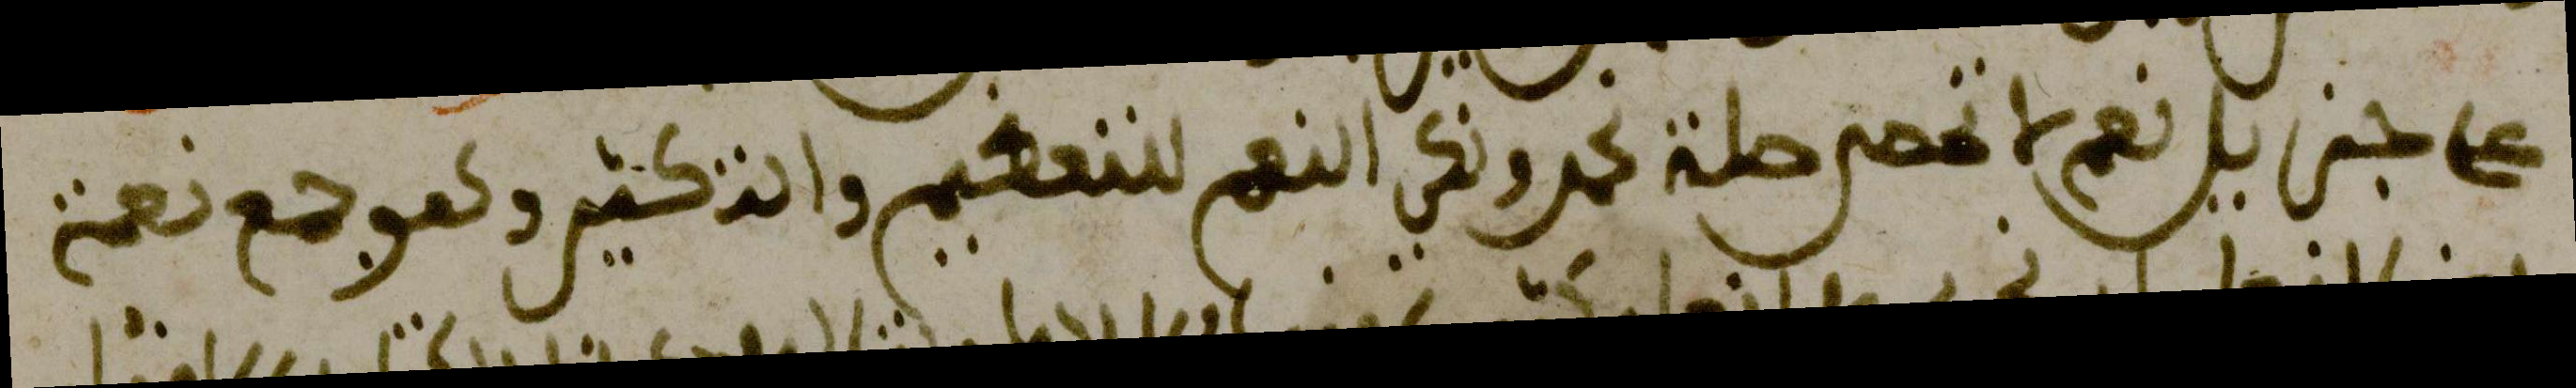على جزيل نعم لا تحصى صلة نحمد ونكر النعم للتعظيم والتكثير وهو جمع نعمة
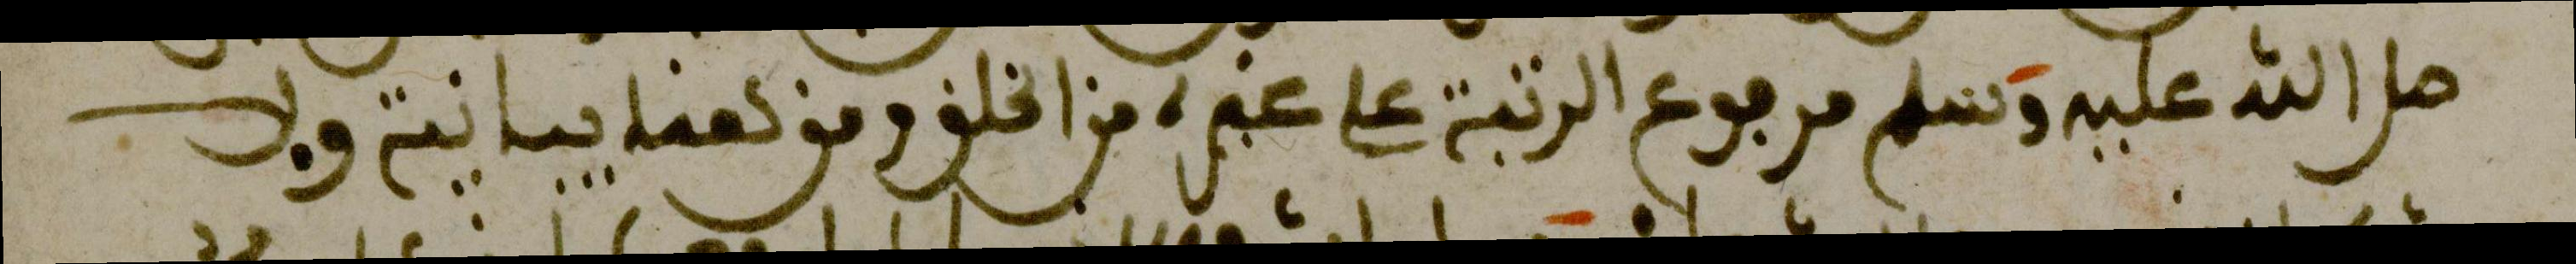صل الله عليه وَسلم مرفوع الرتبة على غيره من الخلق ومن هنا بيانية ولا
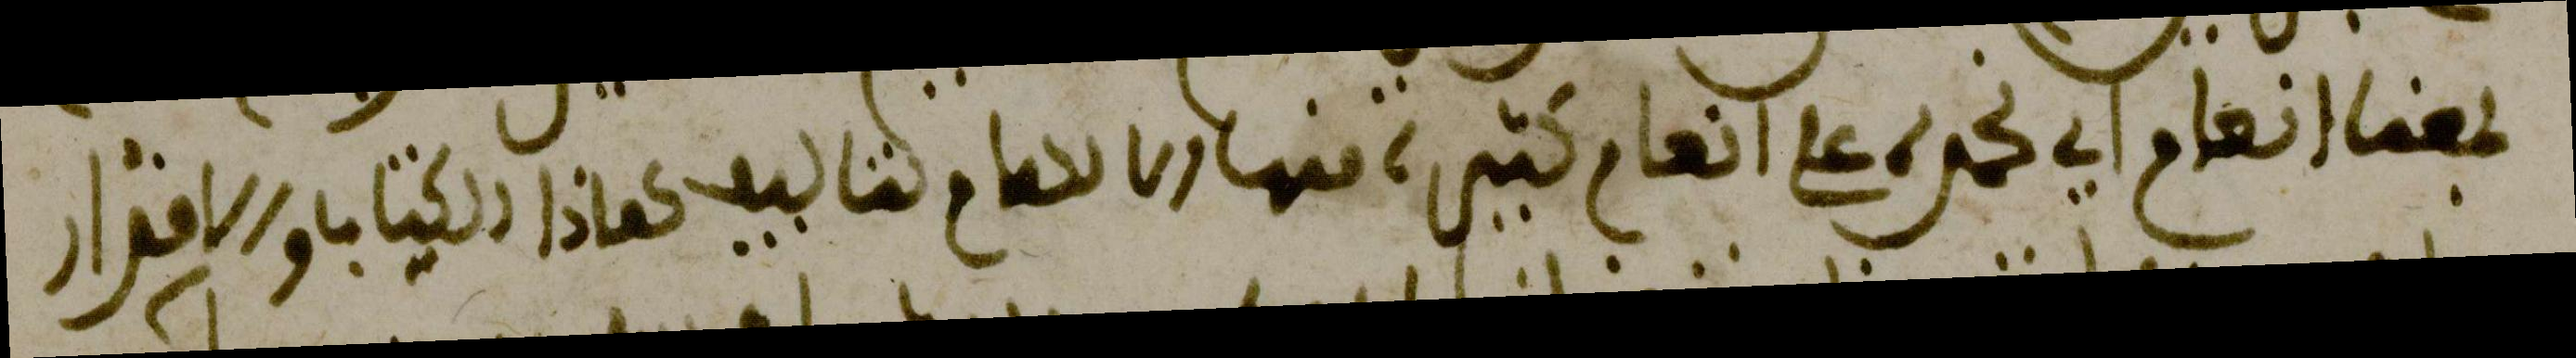بمعنا انعام اي نحمده على انعام كثيرة منها الا لهام لتاليف هاذا الكتاب والاقدار
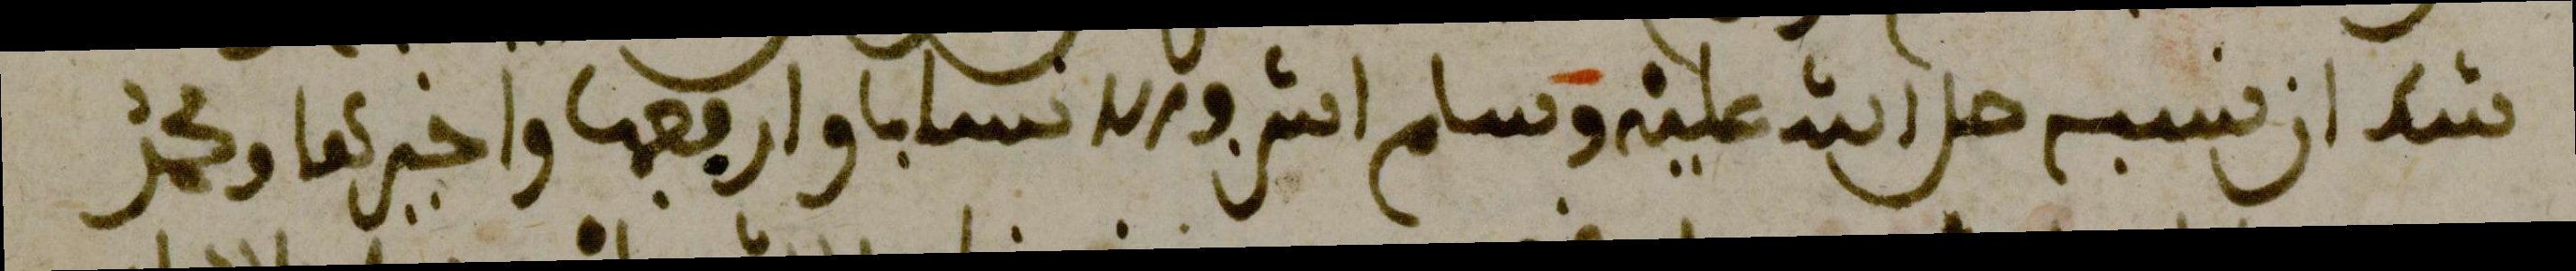شك ان نسبه صل الله عليْه وَسلم اشرف الانساب وارفعها واخيرها ومحمد
